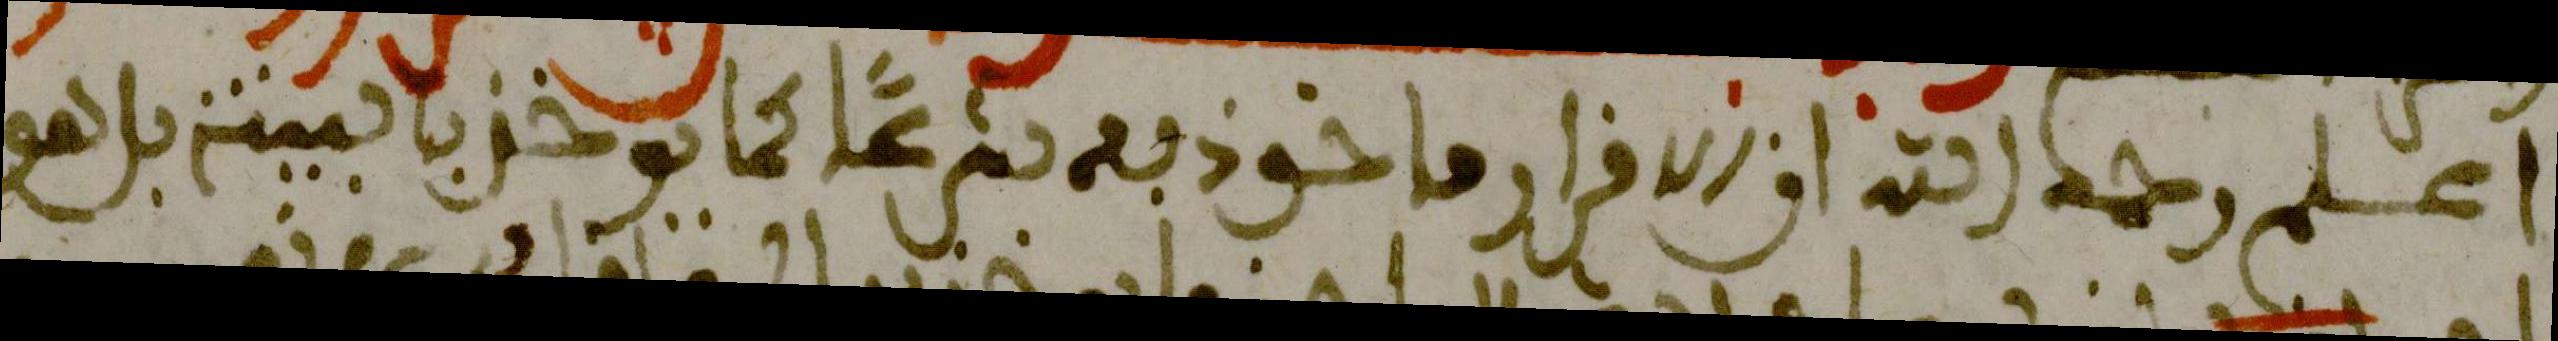اعلم رحمه الله ان الاقرار ماخوذ به شرعًا كما يوخذ بالبينة بل هو
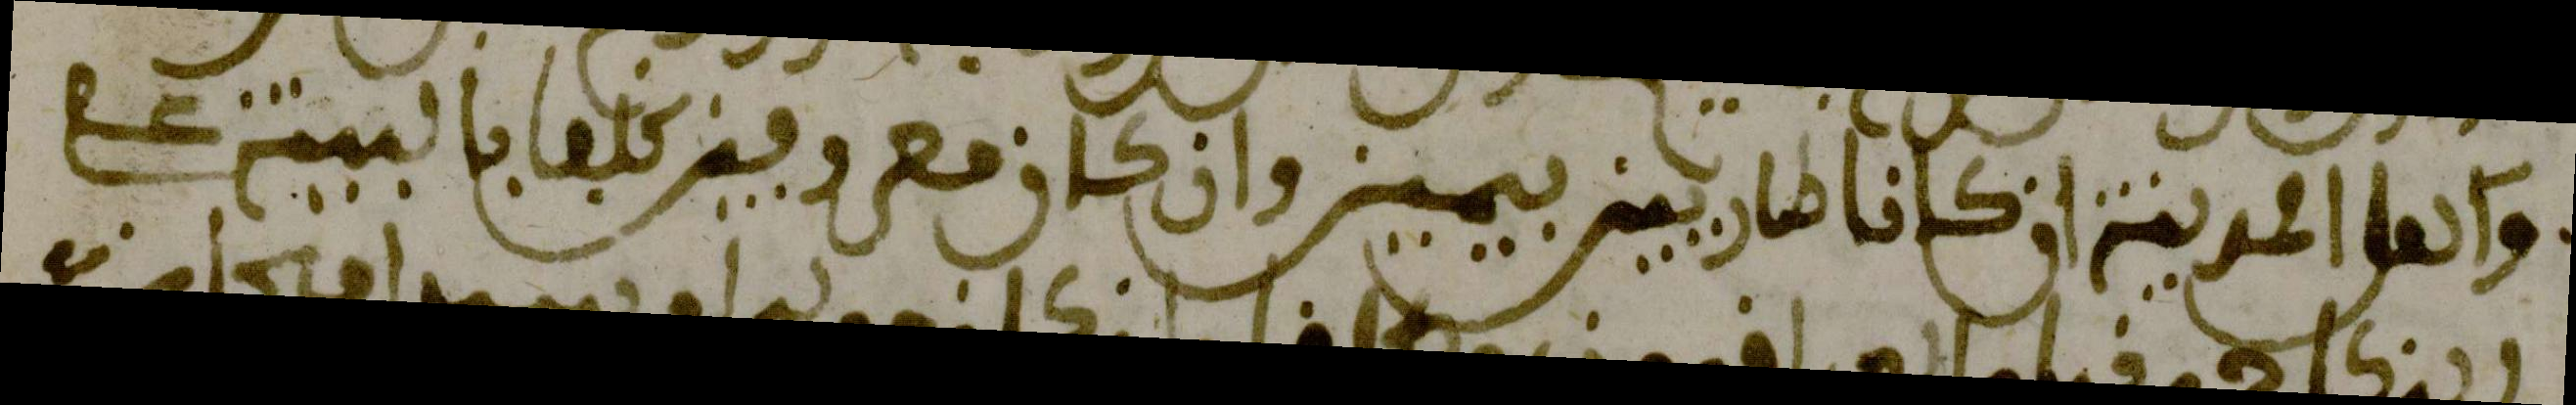واهل المدينة ان كانا طاريين بيمين وان كان معروفين كلفا بالبينة على
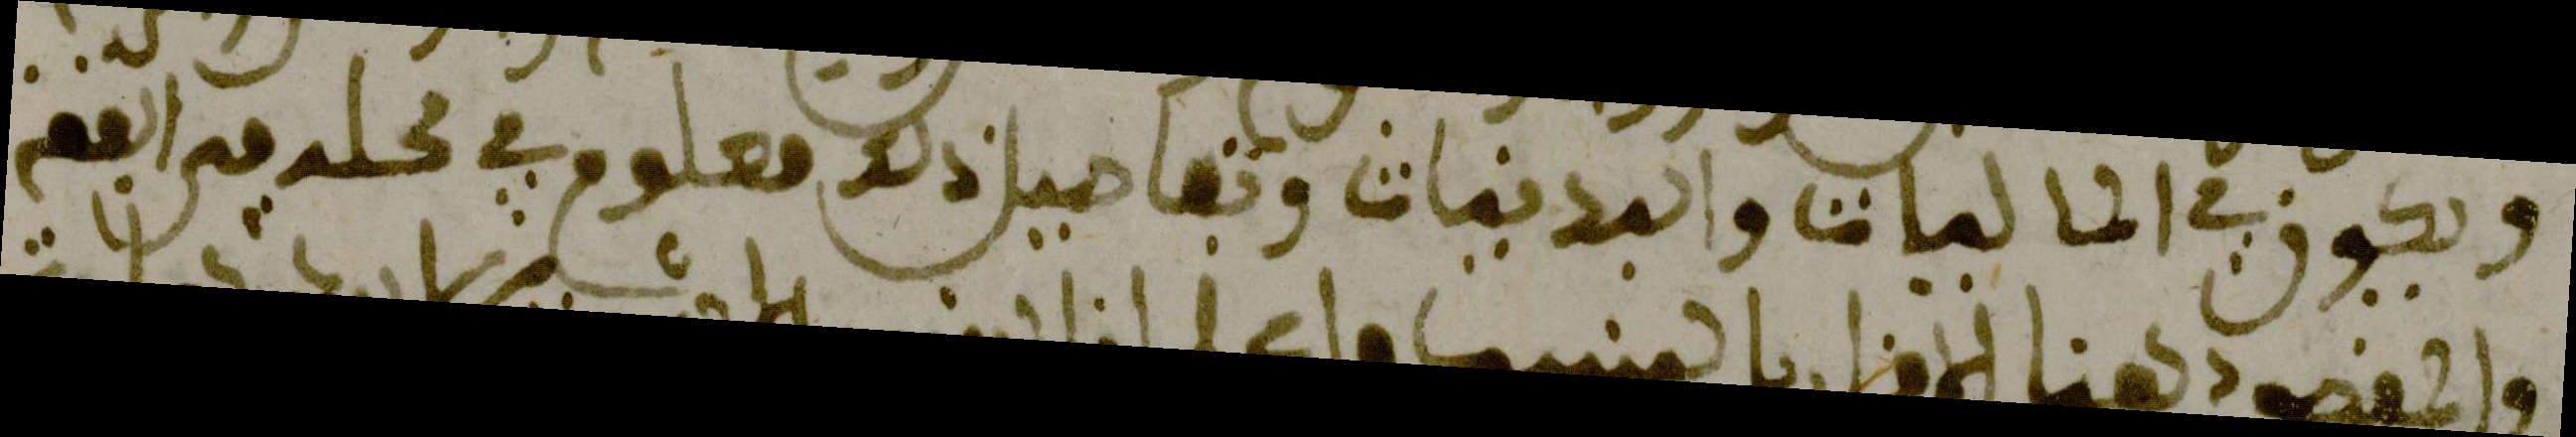ويكون في الماليات والبدنيات وتفاصيل ذلك معلوم في محله في الفقه
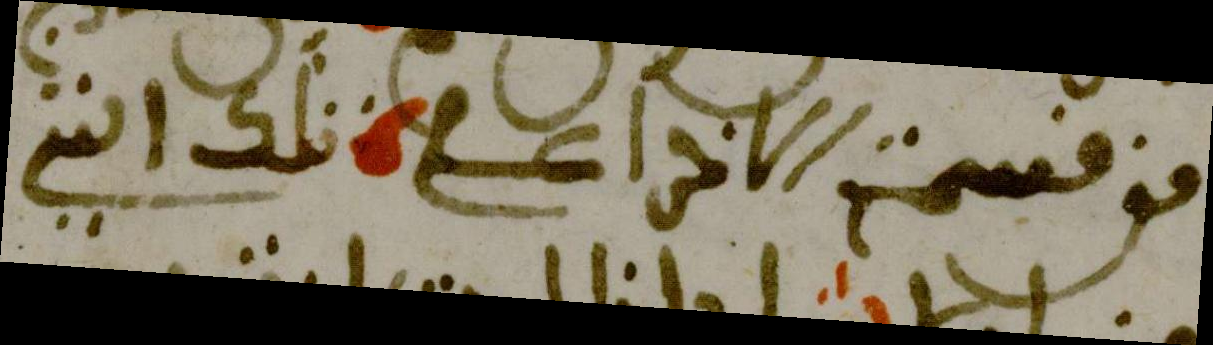من قسمة الاخرا على تلك التي
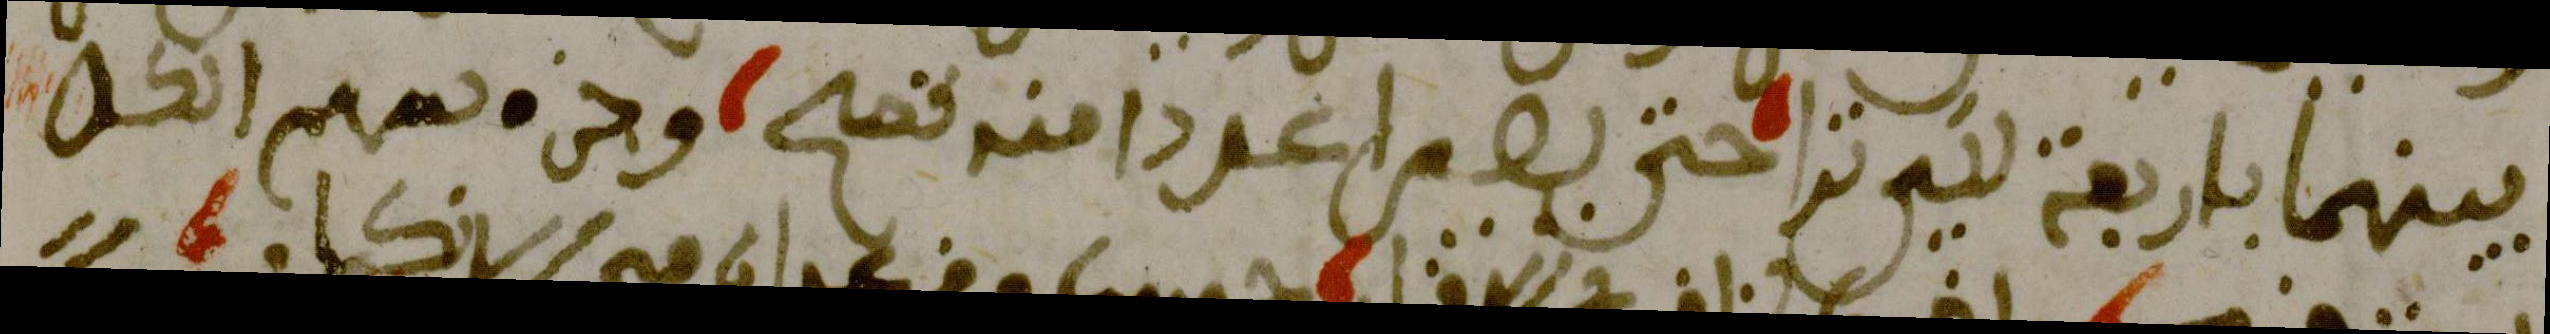بينهما لاربعة لكي ترا حتى يصيرا عددا منه تصح وجزء سهم الكل
